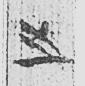之
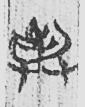與
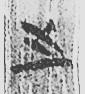之
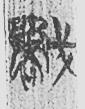戰
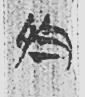於
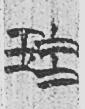珪
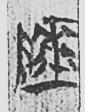陵
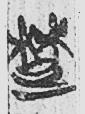楚
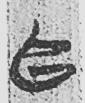𠂤
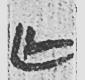亡
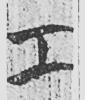工
